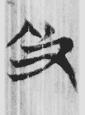及
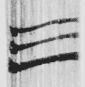三
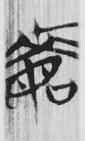{每口}
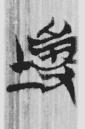{土尃}
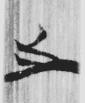之
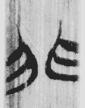非
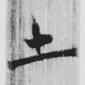土
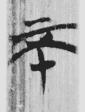不
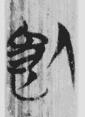飤
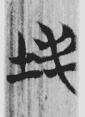{土毛}
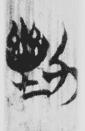{幽土力}
